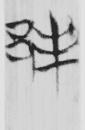邦
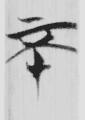不
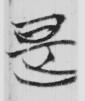是
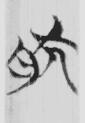肰
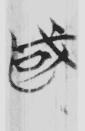或
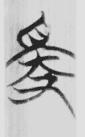爯
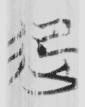起
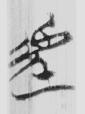𫊟
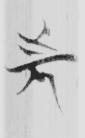先
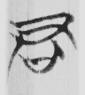君
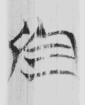於
